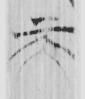天
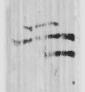下
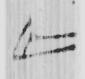亡
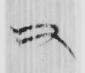又
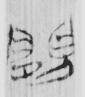{門夕刀}
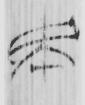民
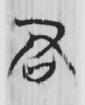君
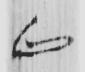㠯（以）
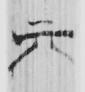亓
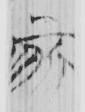所
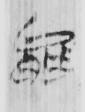能
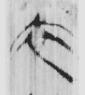衣
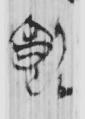飤
